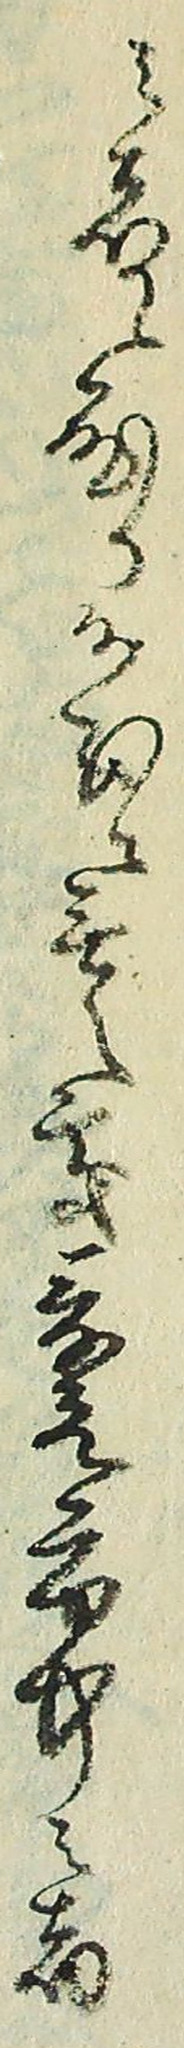之者ニ懸り候義ニ無之處爰元市中之者
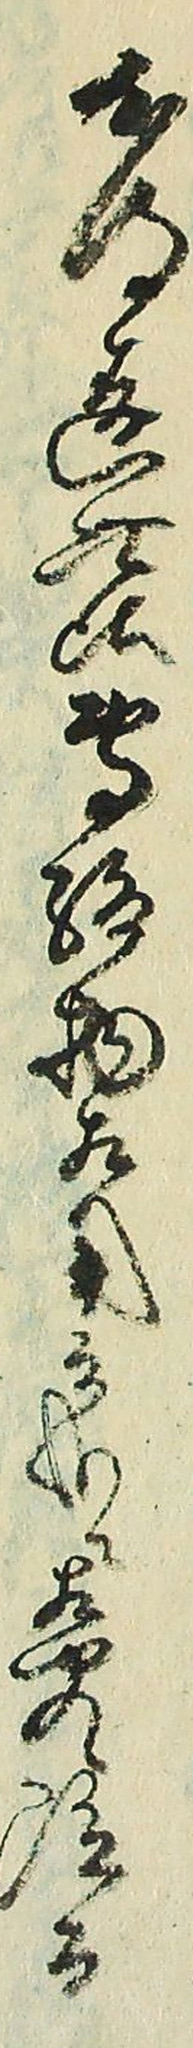心得違此比専絹物相用候哉ニ相聞候随而
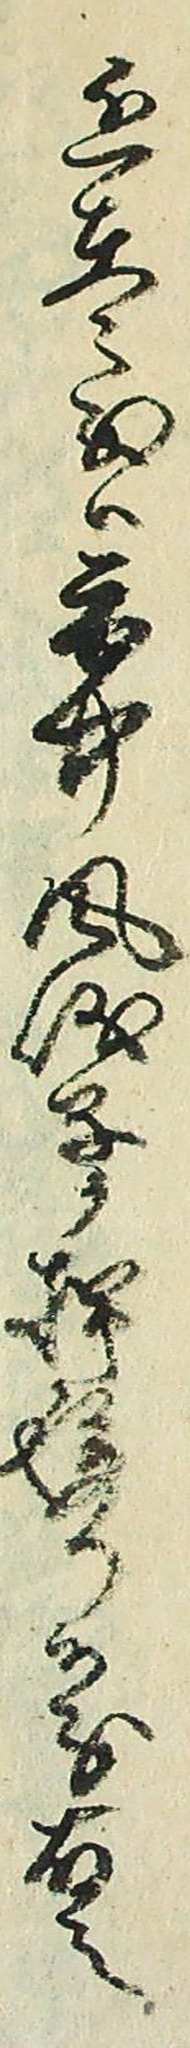近在之義ハ市中風儀早ク押移り候義有之
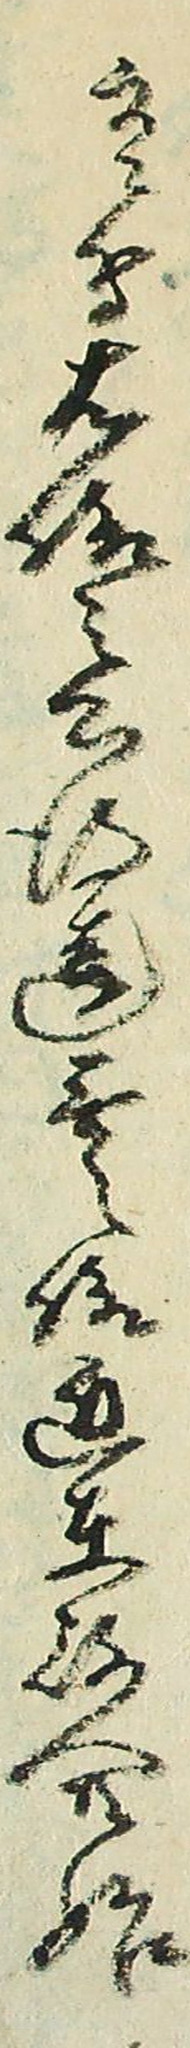候ニ付右様之心得違無之様近在役人共始

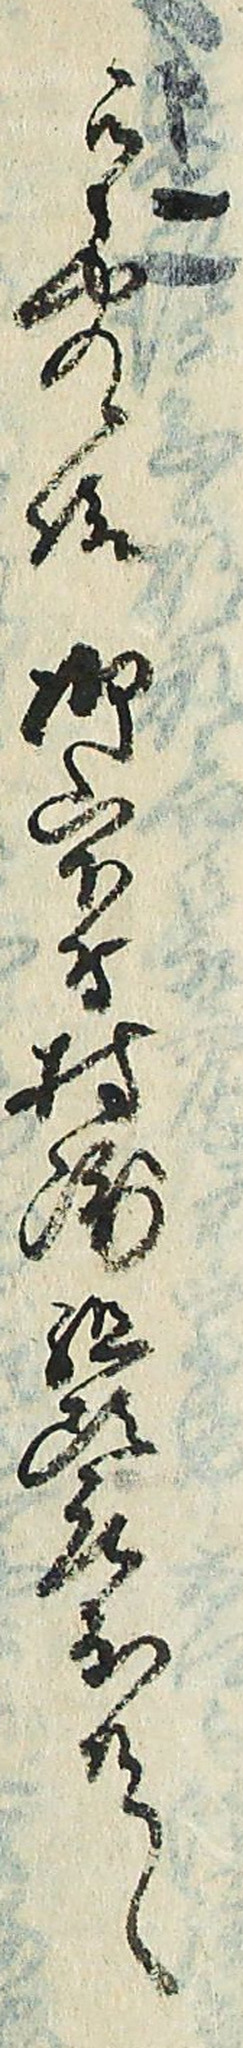被申聞候様御山下付村浦組頭庄屋共へ
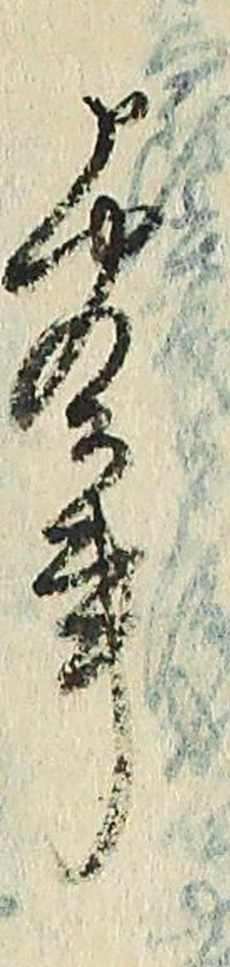申聞候事
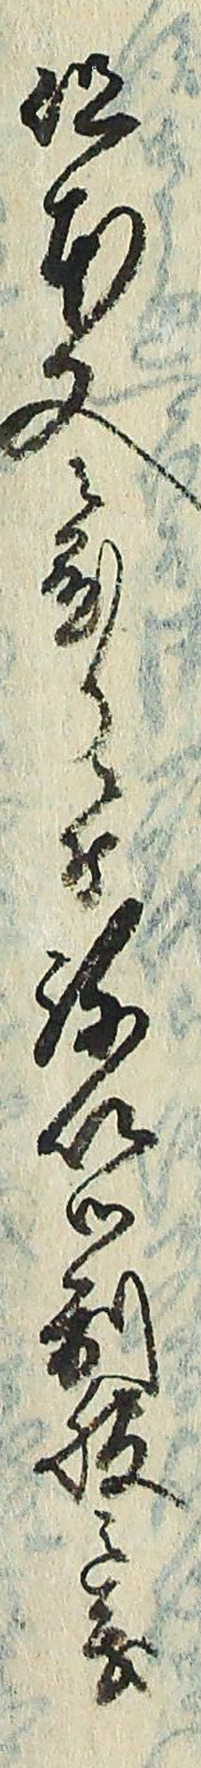但本文之懸りニ付弥以御制服之義
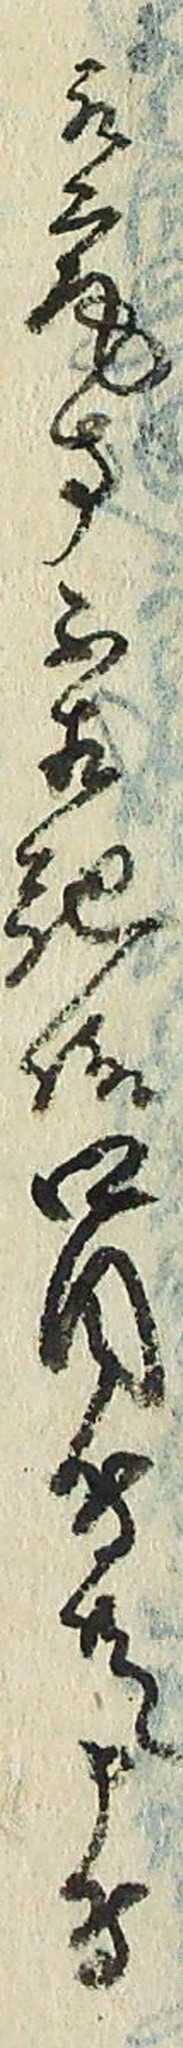取究方不相弛様郷目付共へ申付
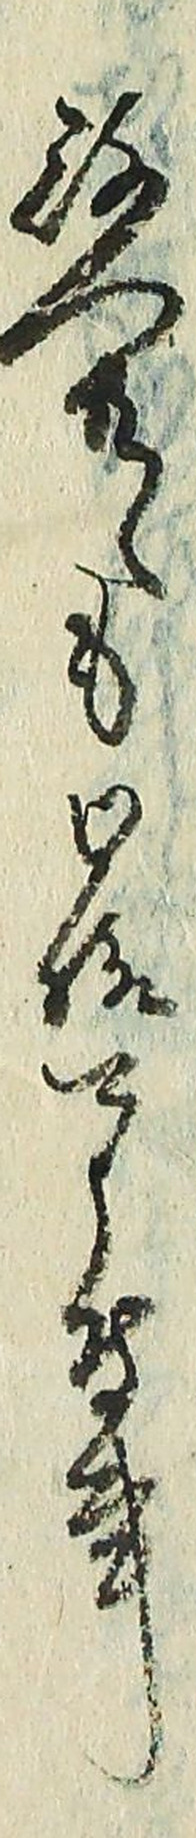役人共へも同様可申付事

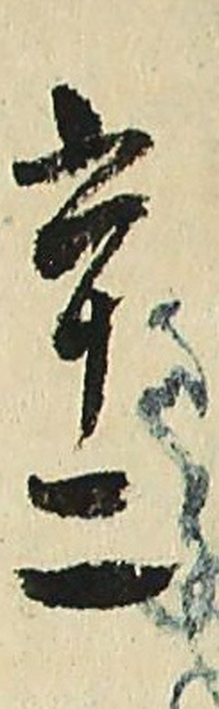六十二

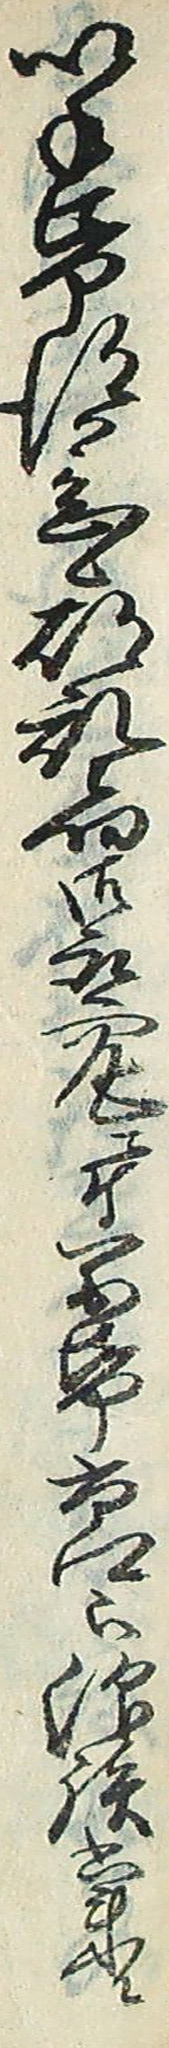以手帋得御意候胡乱者御取究ニ付別帋市郷江仰談書来ル
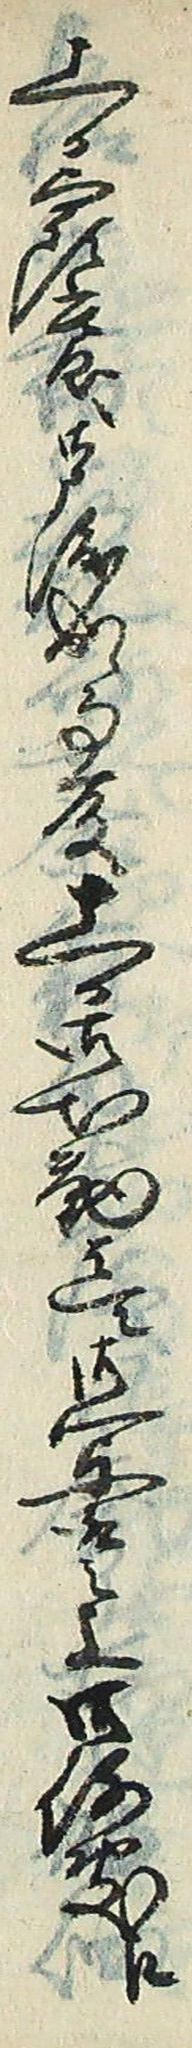十一日与頭庄屋へ御申渡成候事故十一日御出勤迄ニ御写取之上御役處江
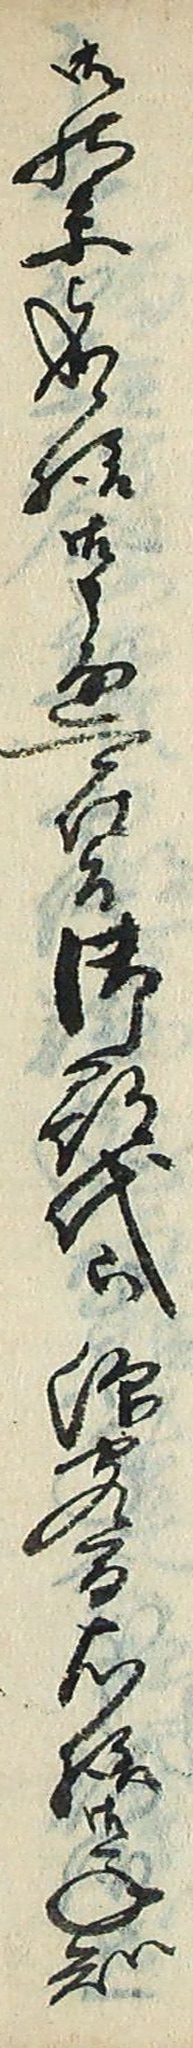御持参被成候様御申通可仕旨御郡代被仰聞候間右様御承知
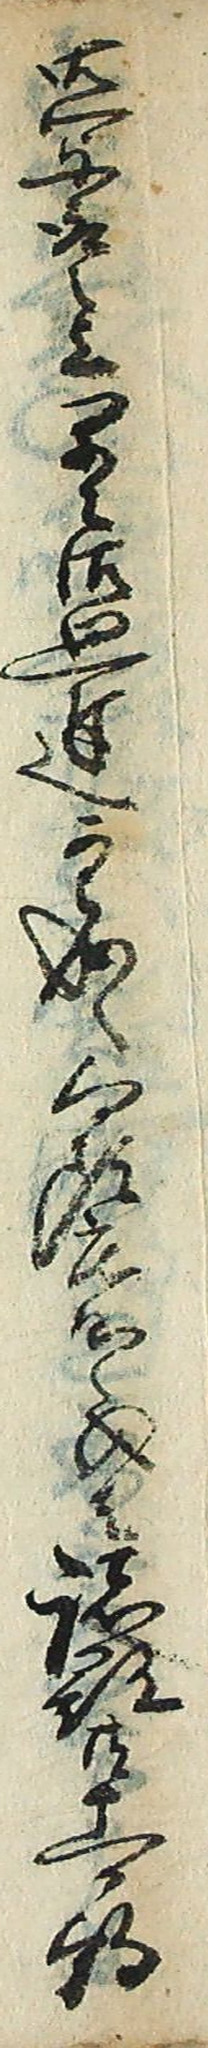御写取之上早々御廻達可被成候与頭庄屋之義者諸郡共十一日朝
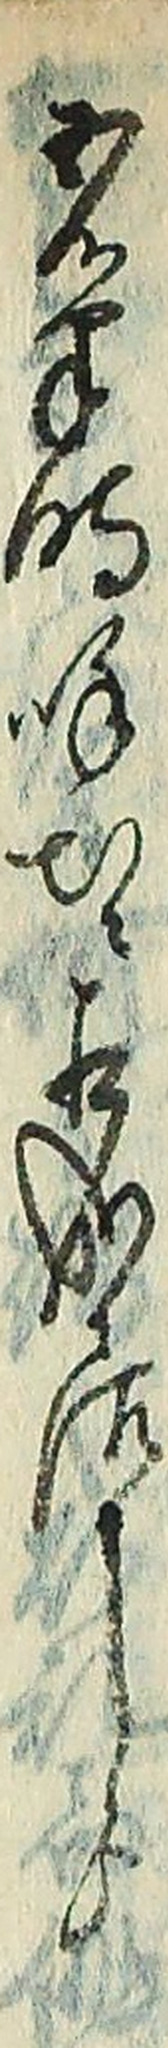五ツ半時呼出ニ相成居申候
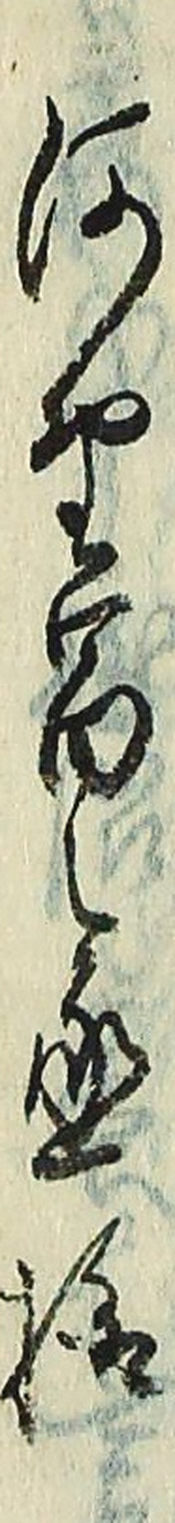河野冨之丞様
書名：諸御趣意書并御下知向之写
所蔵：鳴門教育大学 Naruto University of Education
